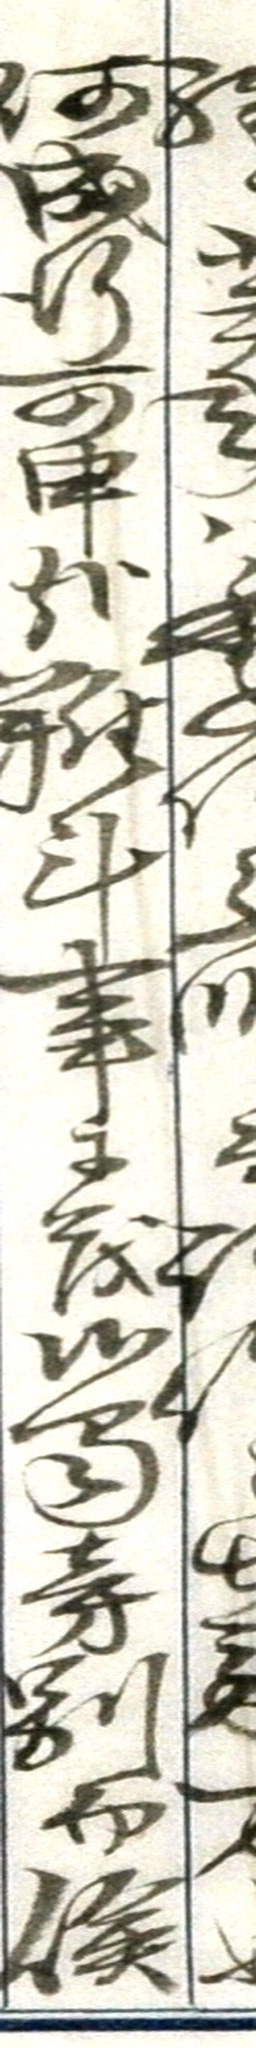可成行可申哉難計事に茂候間旁別而倹
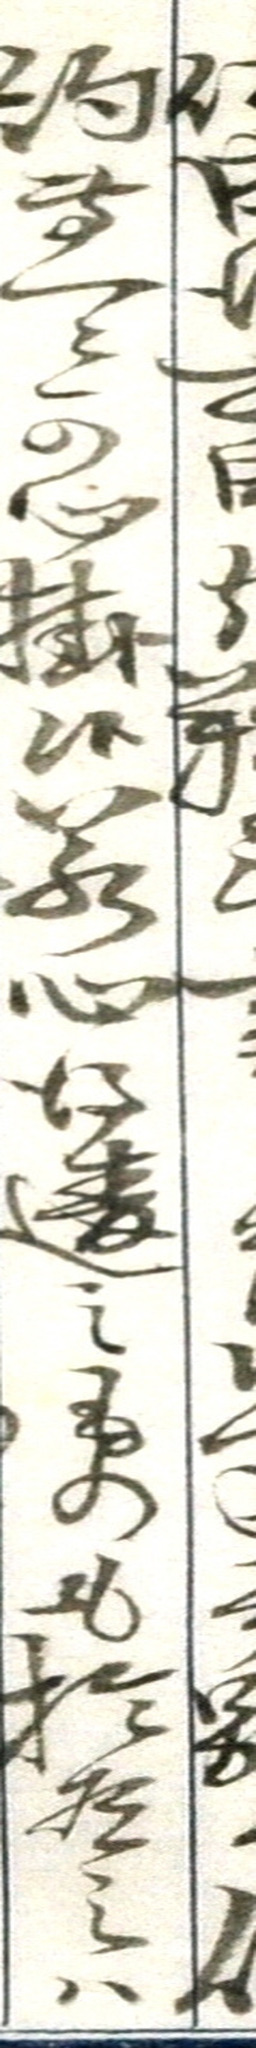約専一ニ可心掛候若心得違之ものも於有之ハ
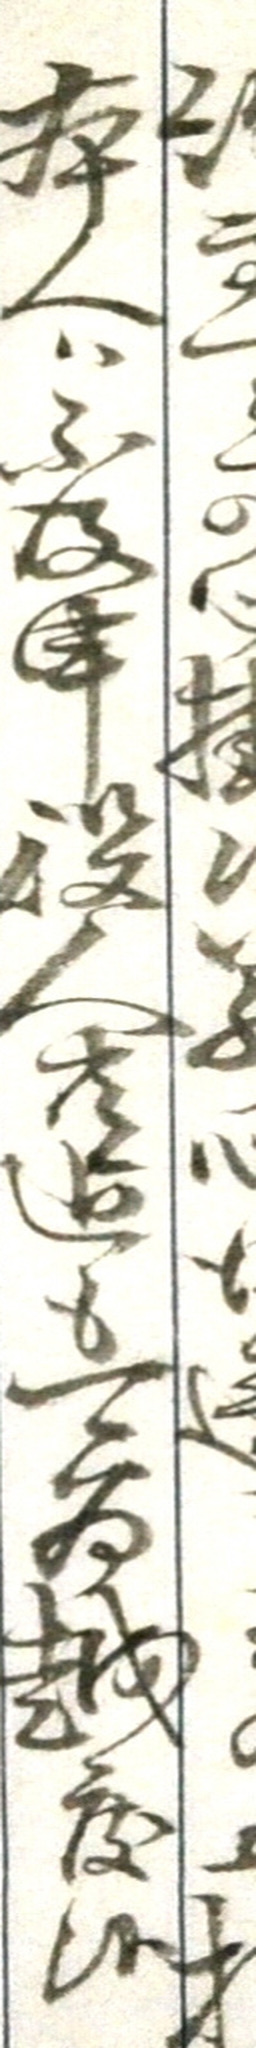本人ハ不及申役人共迄も可為越度候
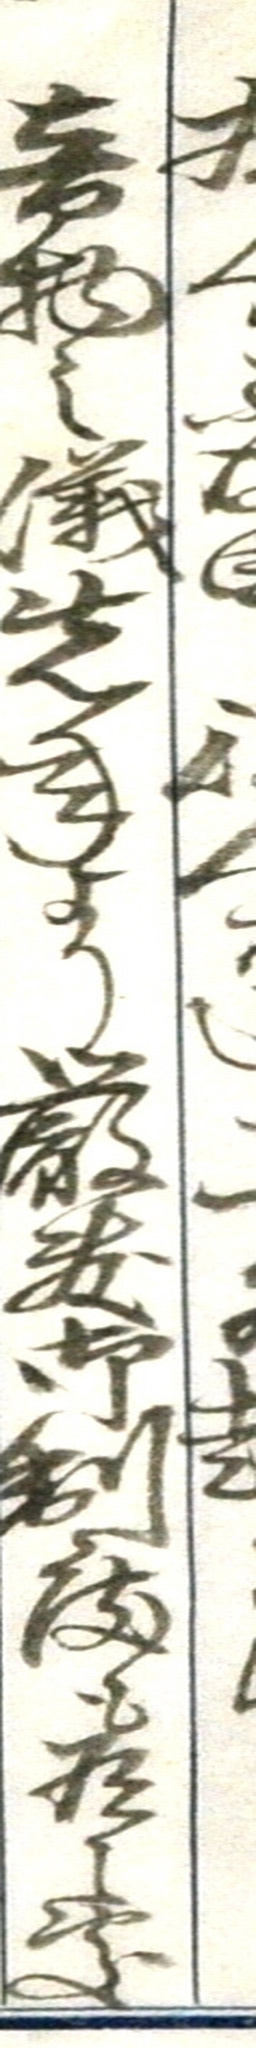一音物之儀先年より厳敷御制度も有之処
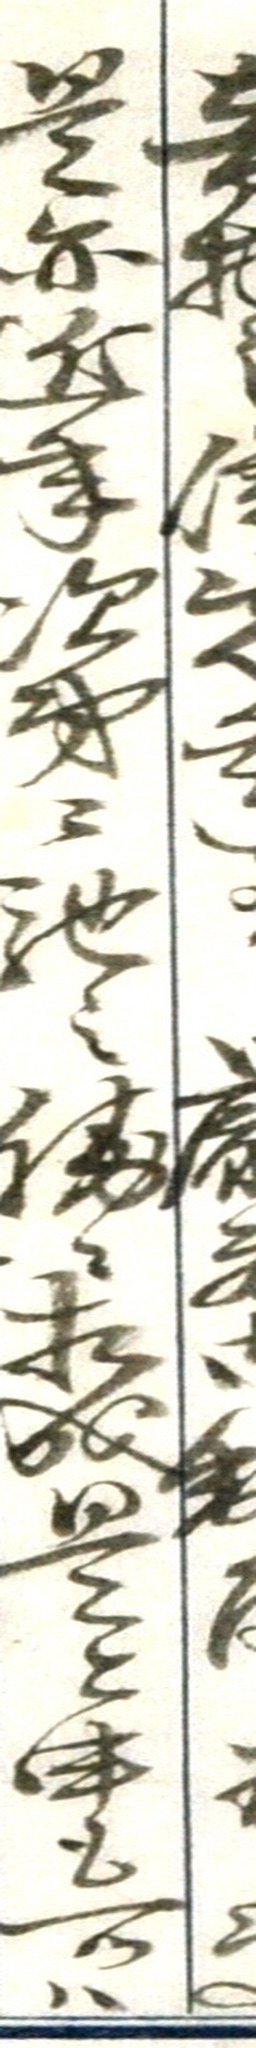是亦近年次第ニ弛み勝ニ相成是と申も一ツハ
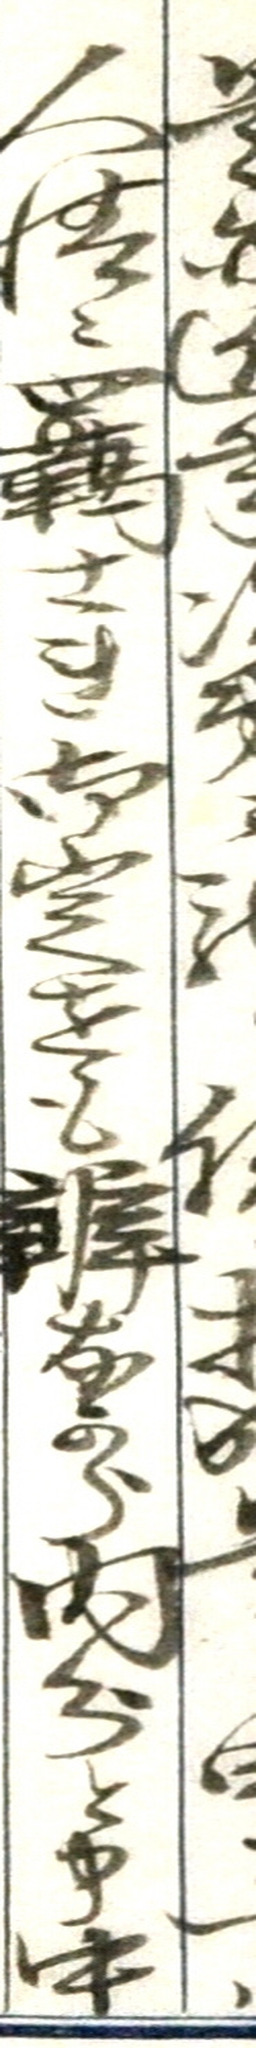人情ニ羈され御定をも弁ながら内分と申中

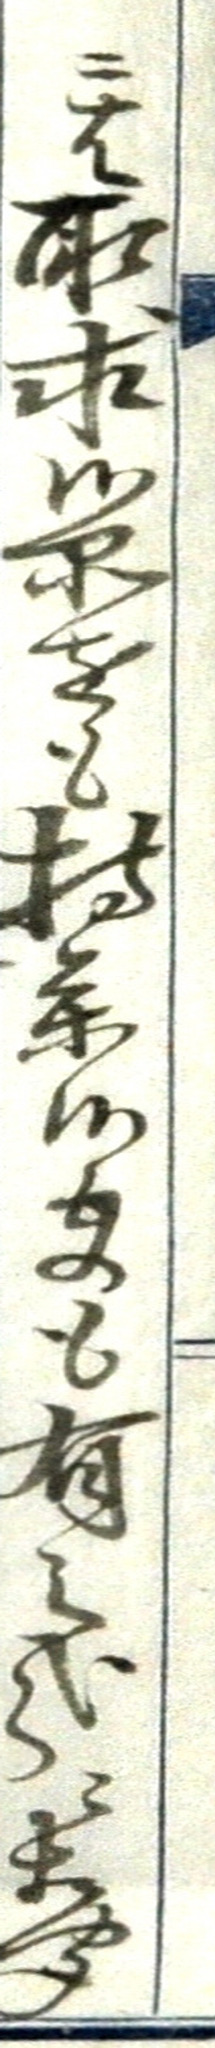ニは取求候品をも持参候ものも有之哉に相聞
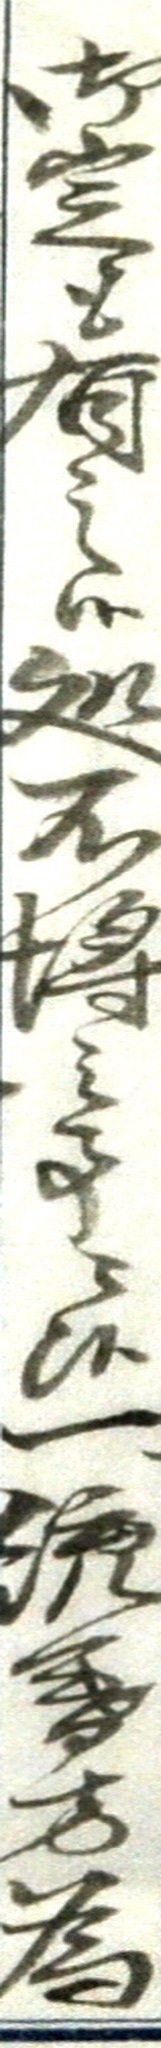御定も有之候処不埒之事ニ候一統暮方為
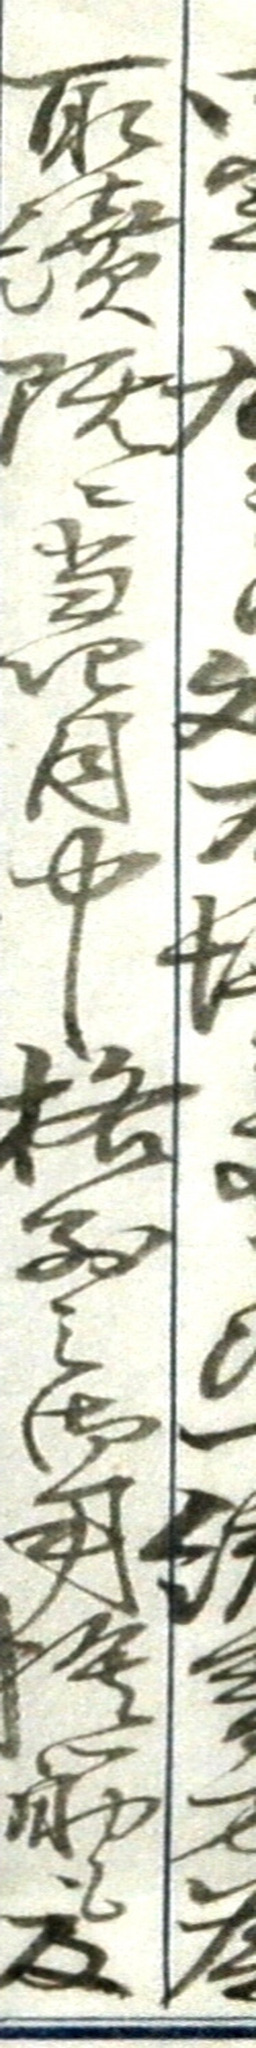取続既ニ当四月中格別之御用捨筋も及
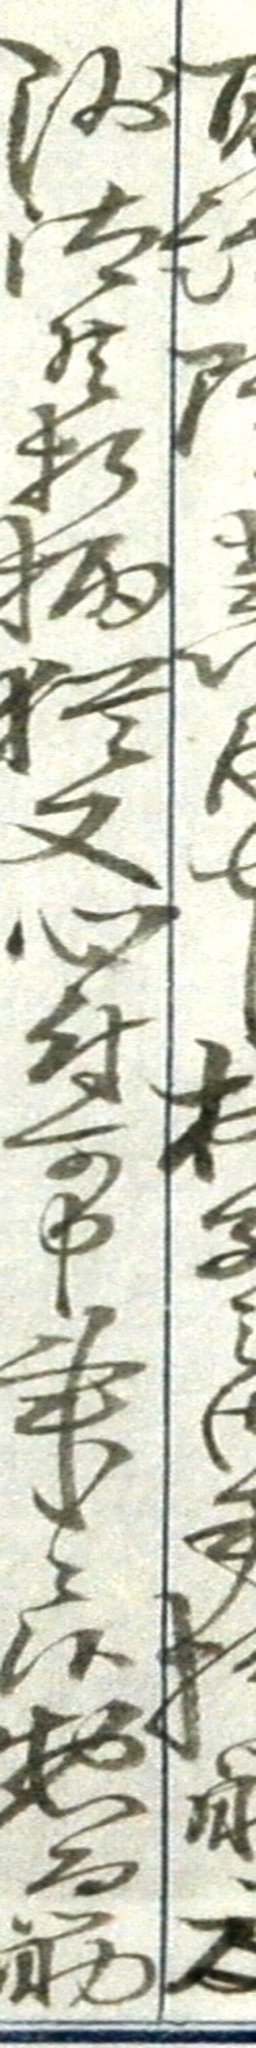沙汰候折柄猶又心付可申事ニ候惣而筋
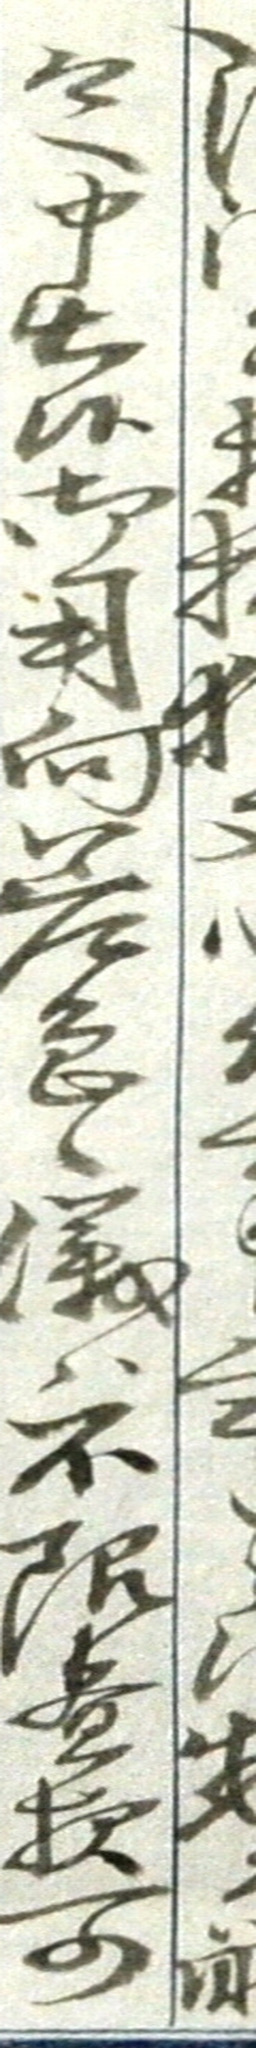々ヘ申出候御用向差急候儀ハ不限昼夜可
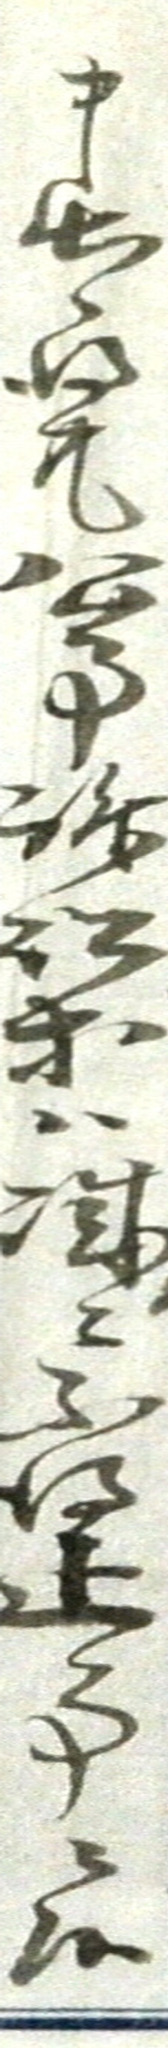申出候得共公事訴訟等ハ殊ニ不得止事ニ候
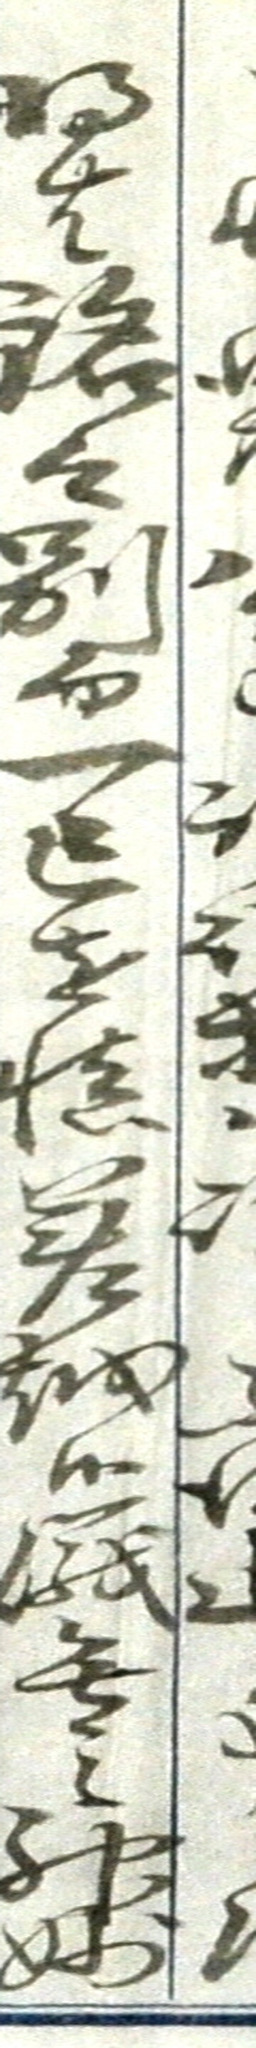得は銘々別而一己を慎差越候儀無之神妙
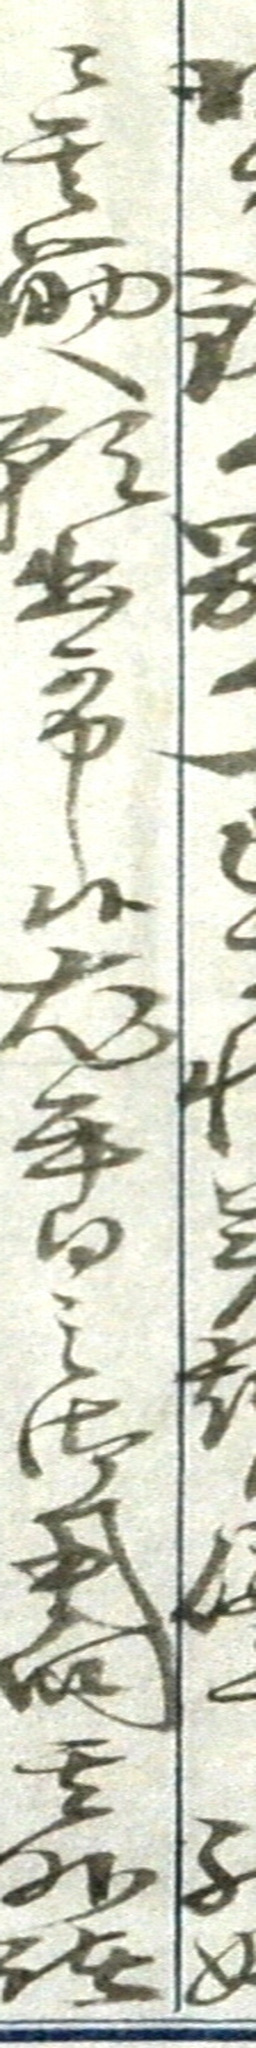ニ其筋ヘ願出可申候尤平日之御用向其外諸
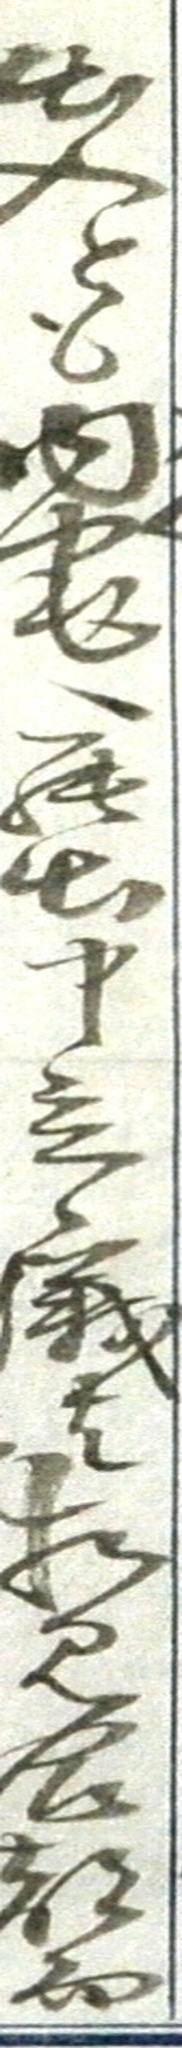出入とも内宅ヘ罷出申立候儀は相見合都て
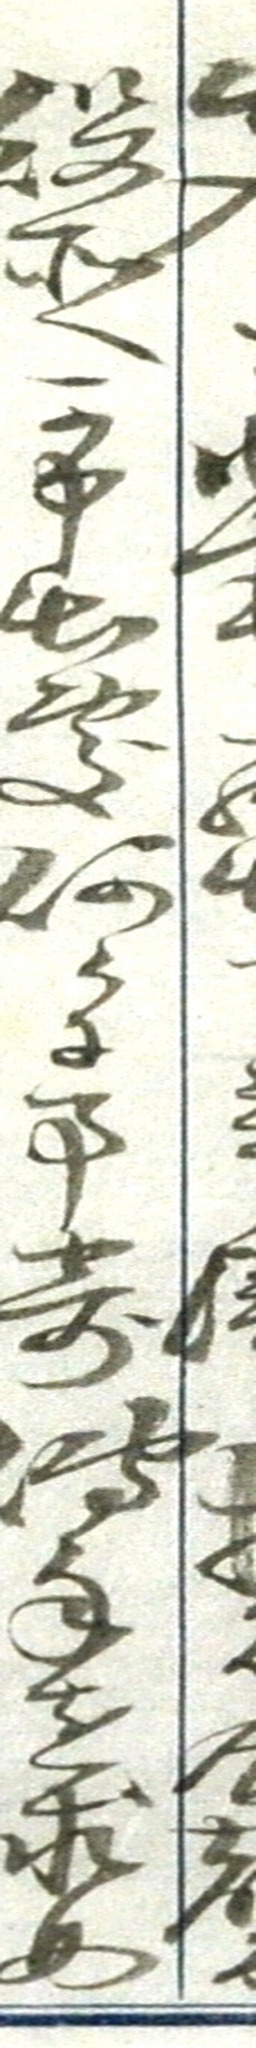役所ヘ可申出処何らに事寄伝手を求め
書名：御触書
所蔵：伊那市立高遠町図書館・合同会社AMANE
